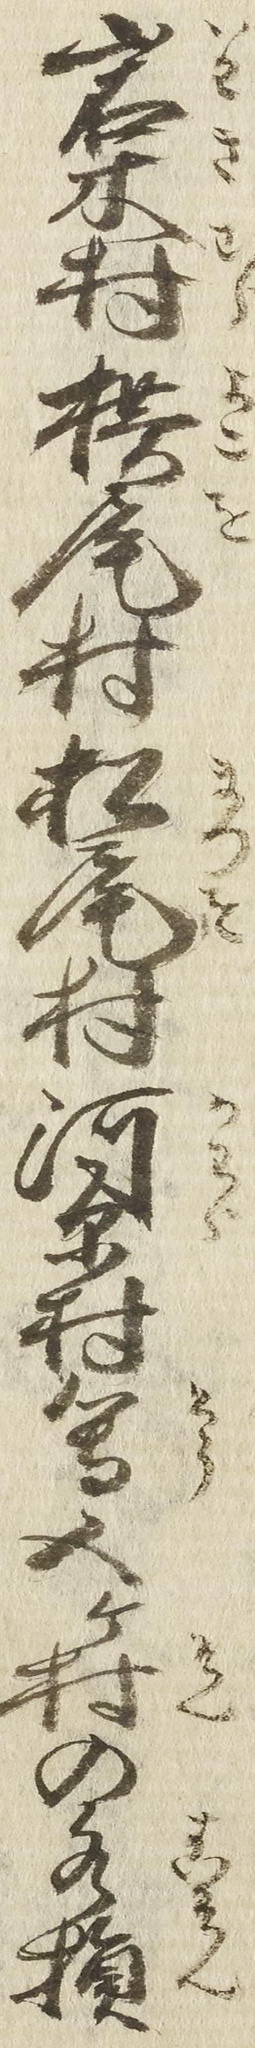岩木村横尾村松尾村河原村等五ケ村の水損
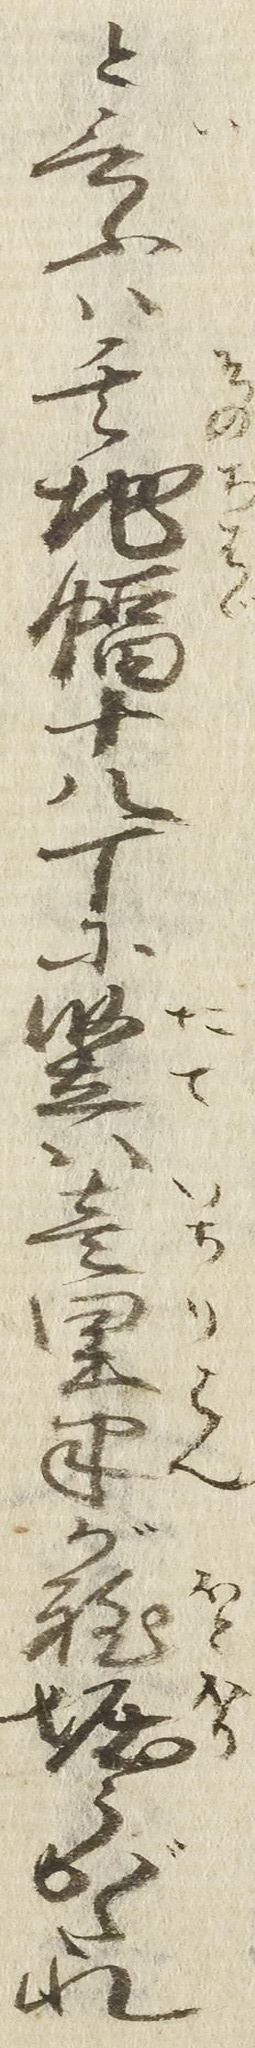と言ふは其地幅十八丁に竪は壱里半が程堀うがたれ
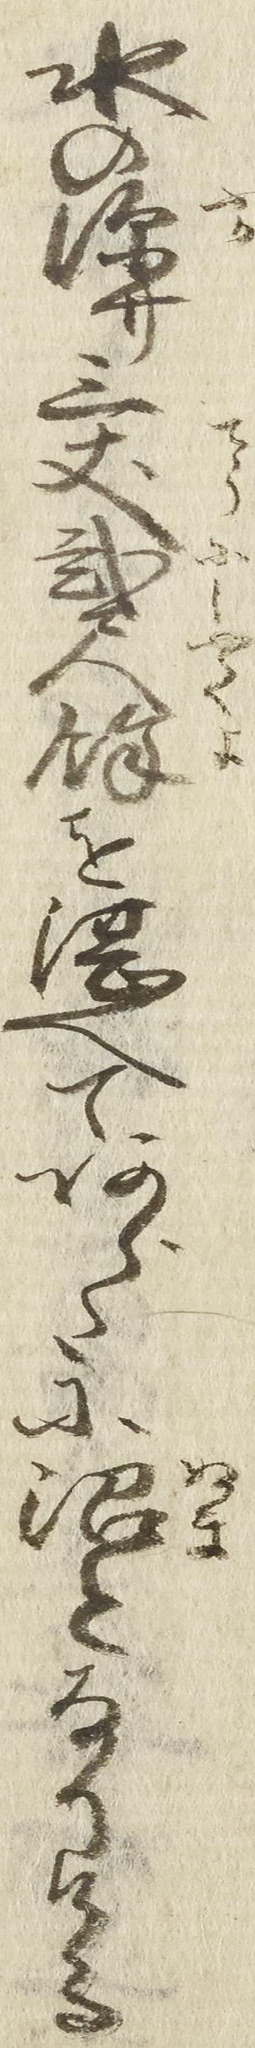水の深サ三丈弐尺余を湛へてあらたに沼となりける
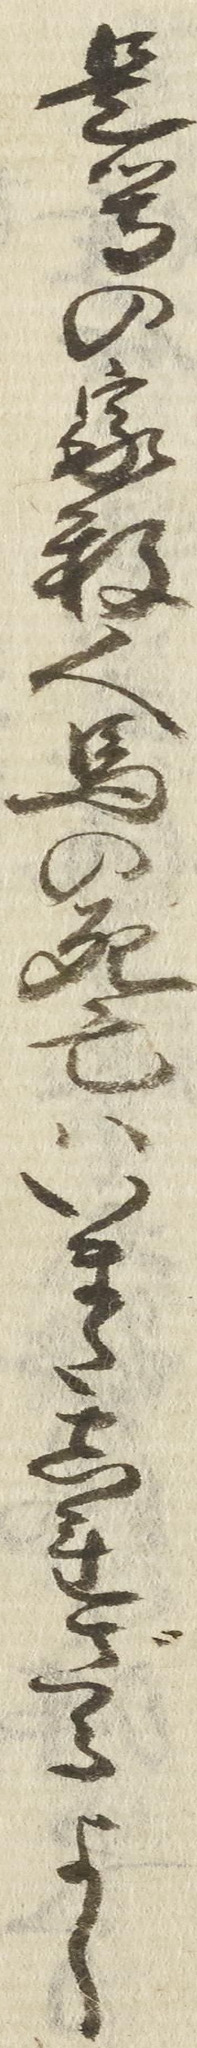是等の家数人馬の死亡はいまたしれざるよし
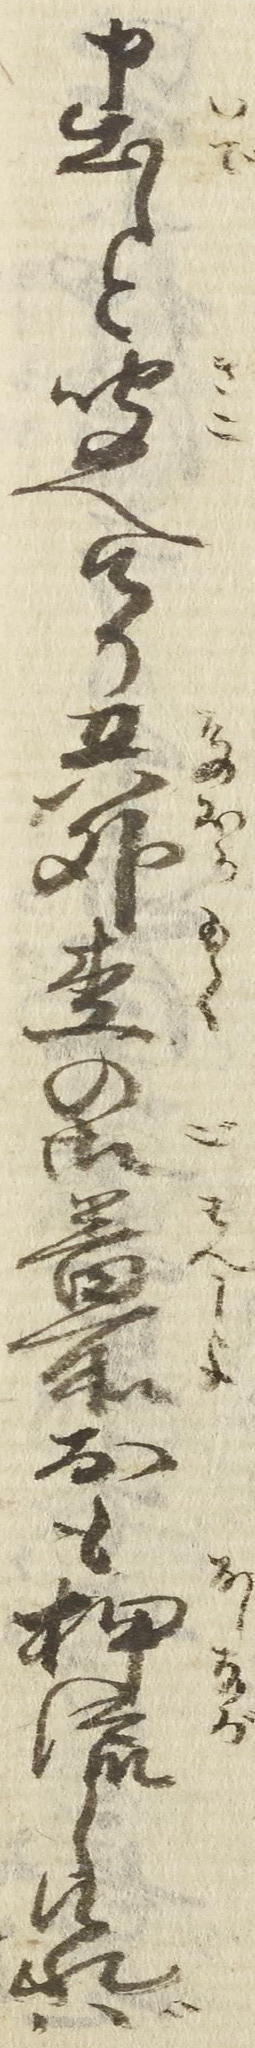申出しと聞へけり其外杢の御番所おも押流しければ
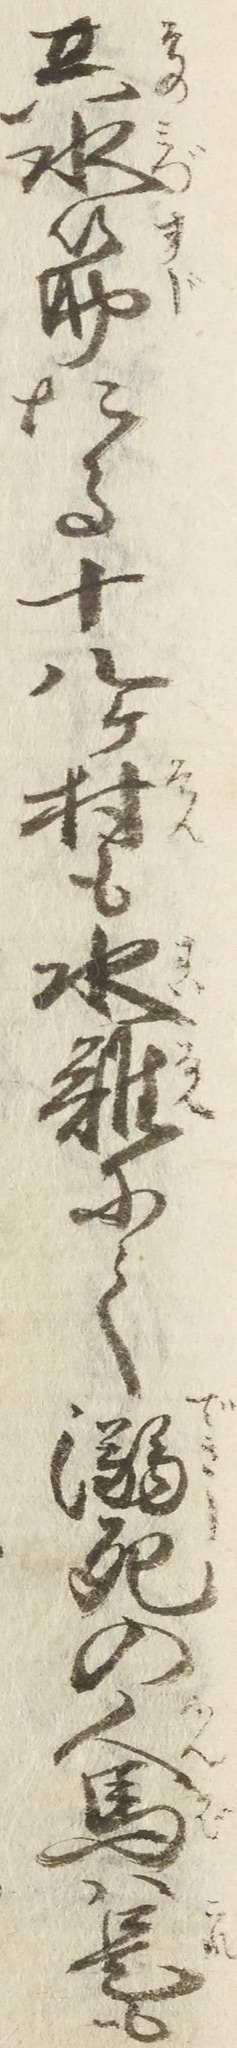其水筋たる十八ケ村も水難にて溺死の人馬は是も
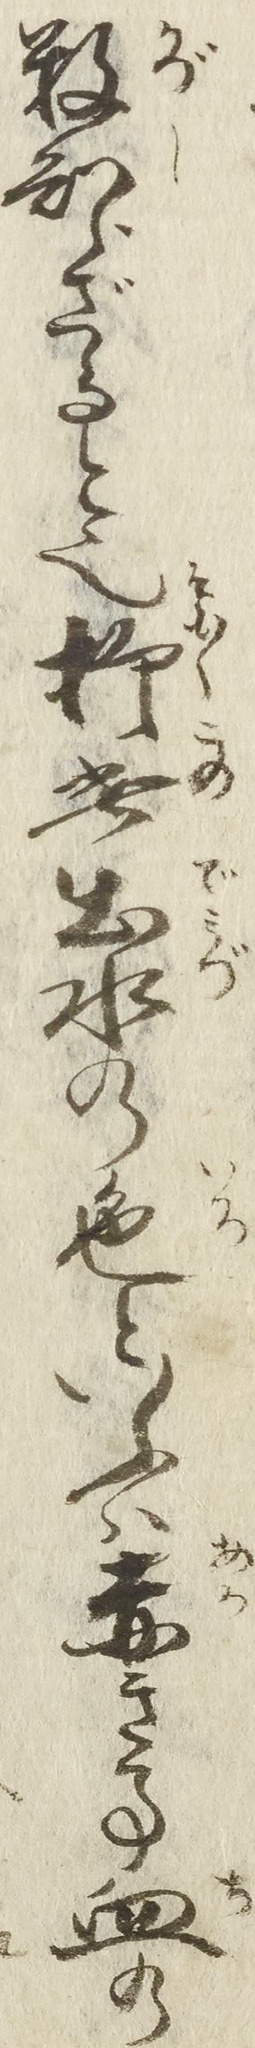数知らざると也抑此出水の色といふは赤き事血の
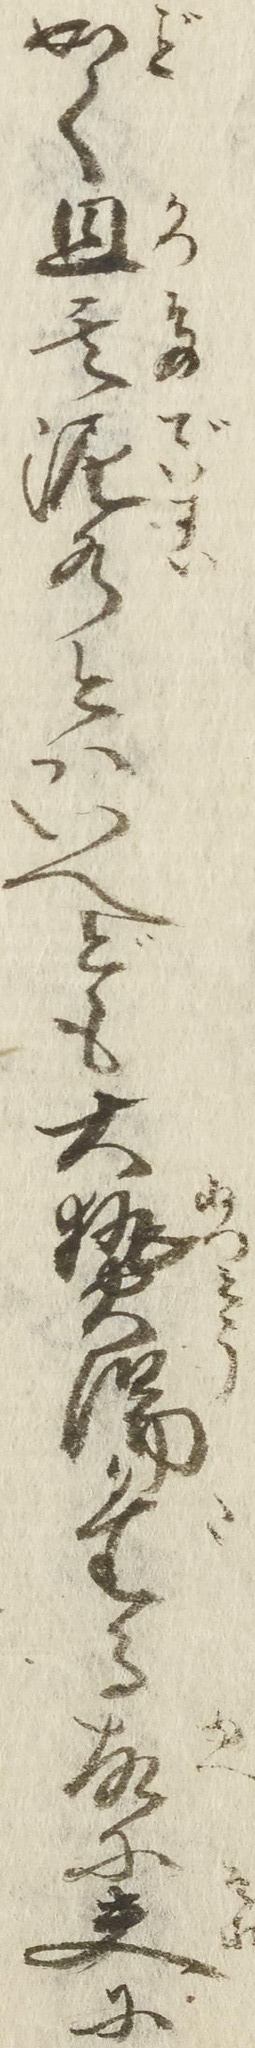如く且其泥水とはいへども大熱湯堂る故に夫に
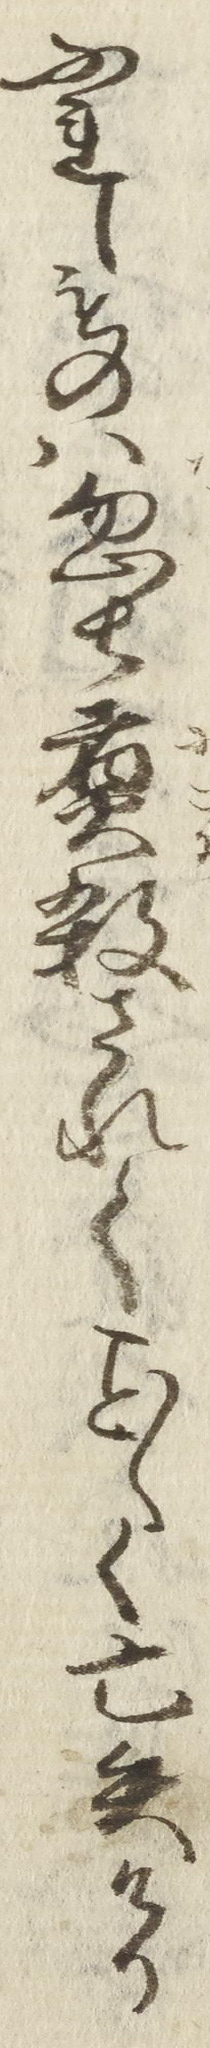ふれしものは忽ち煮殺されてこと〳〵く亡失けり
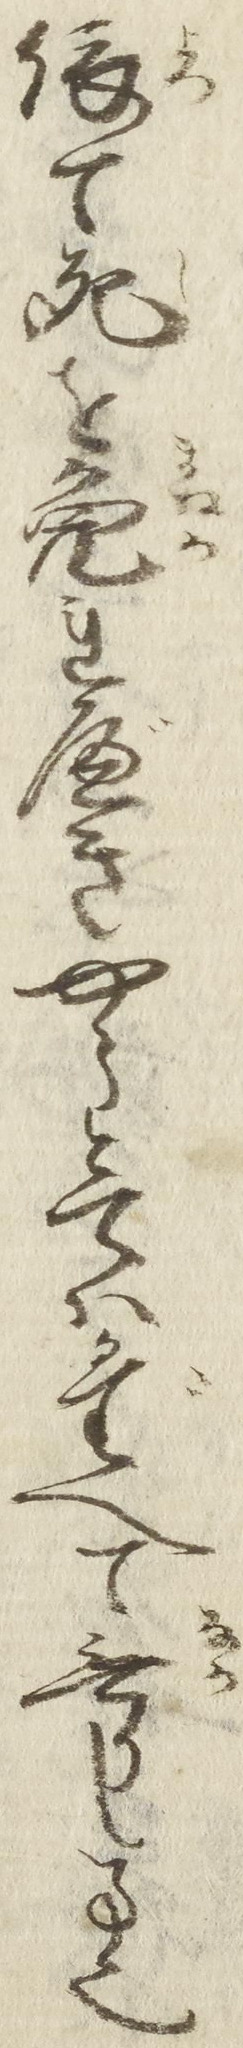依て死を免れべきやうとては堂へて無りし事也
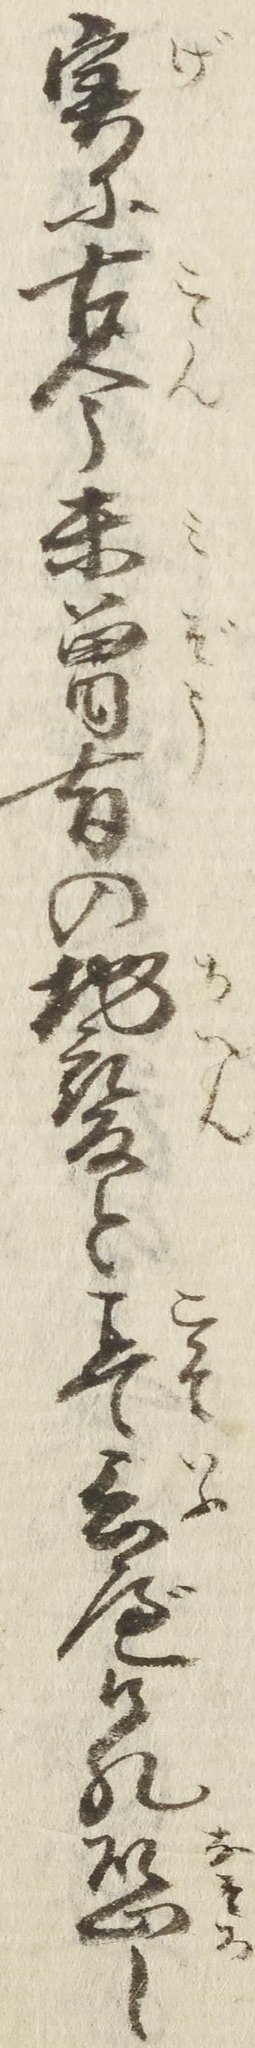実に古今未曽有の地変とこそ言べけれ恐し
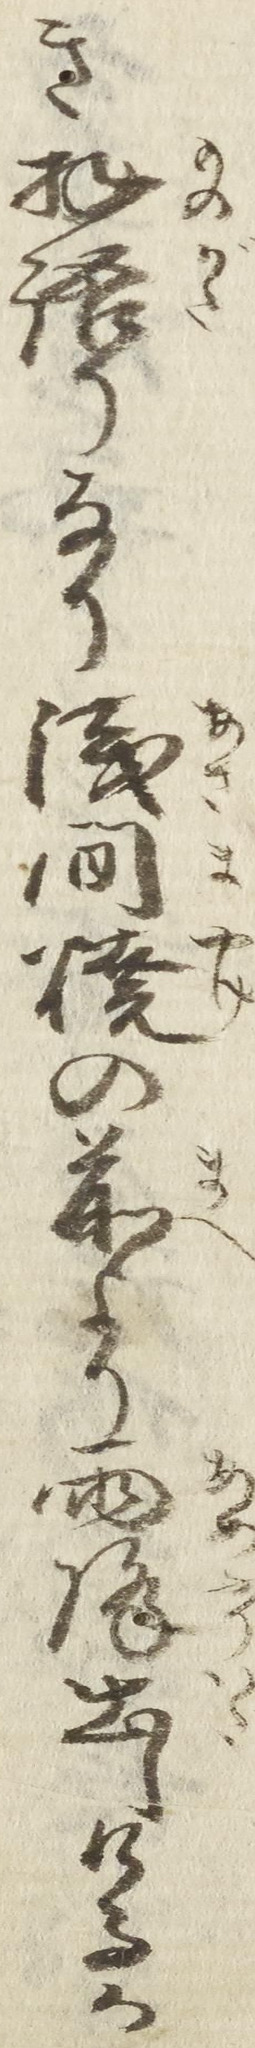き物語りなり浅間焼の前より雨降出しけるか
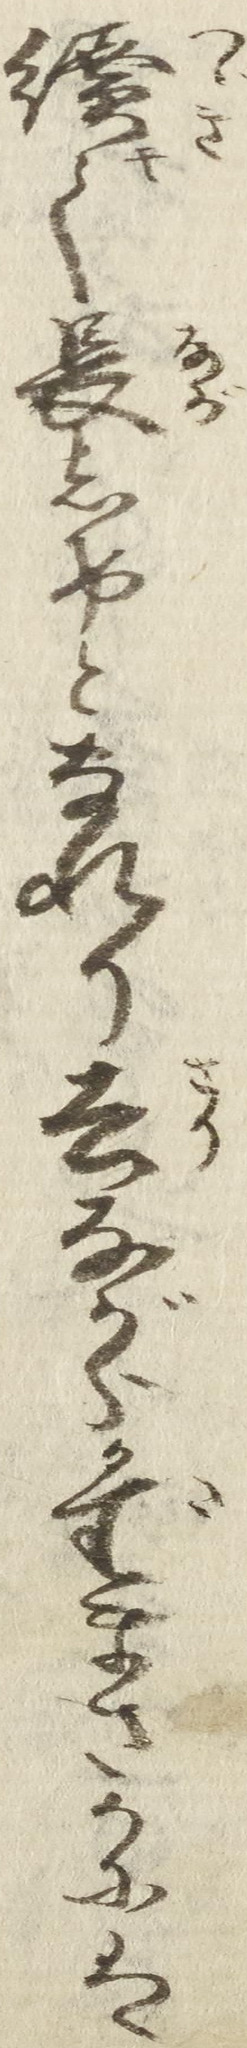続キ〳〵長しけとなれり去ながら堂まさかには

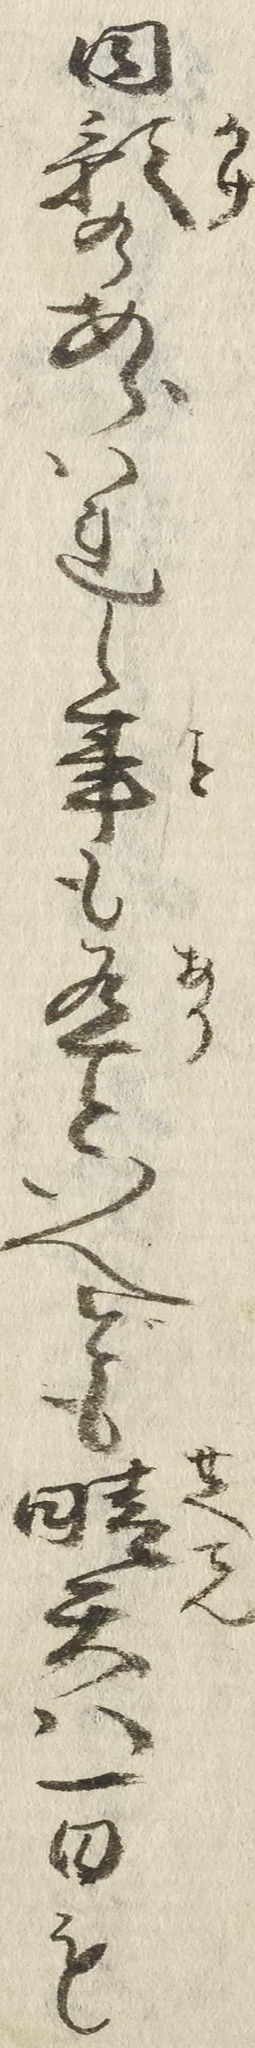日影のあらはれし事も有といへども晴天は一日も
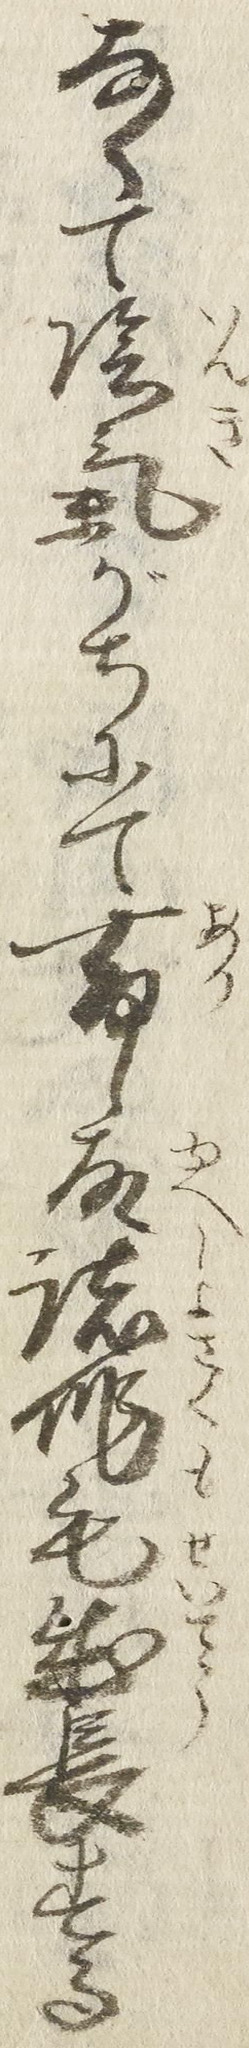なくて陰気がちにて有し故諸作毛成長する
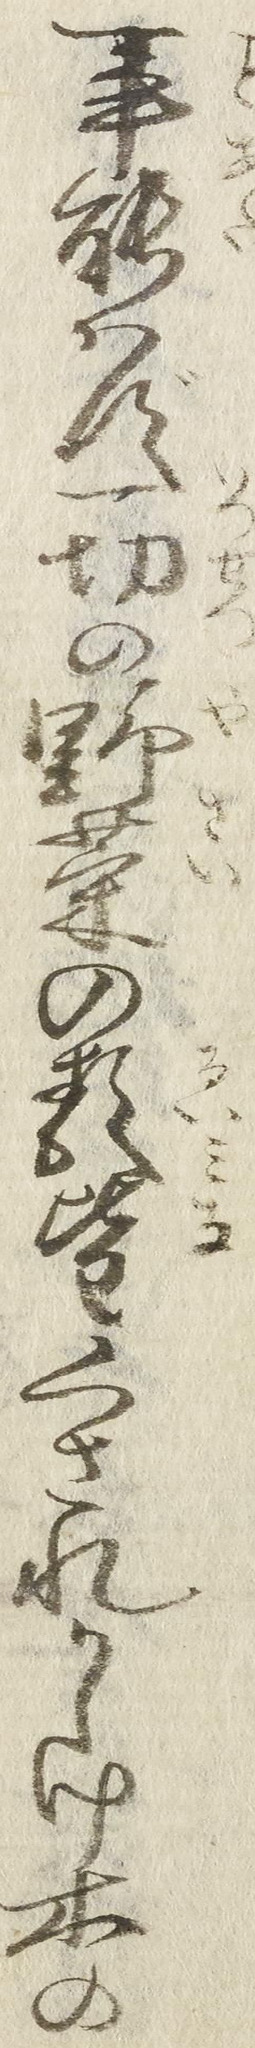事能はず一切の野菜の類皆くされかけ木の
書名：天明奇畧　全
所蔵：東京大学地震研究所図書室 Earthquake Research Institute Library, The University of Tokyo, JAPAN
